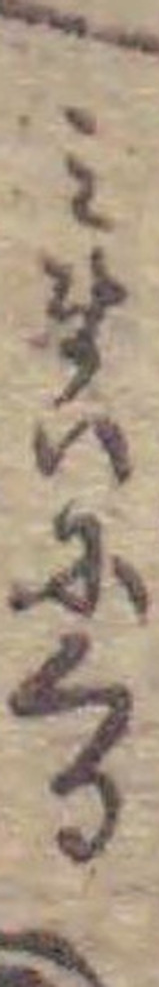みまいにくる
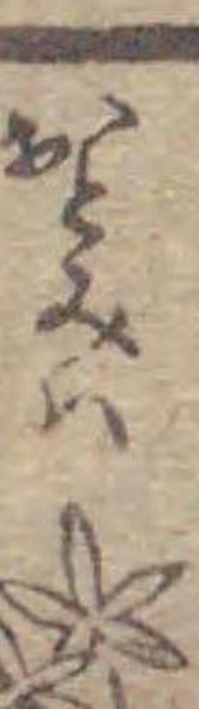おとみは
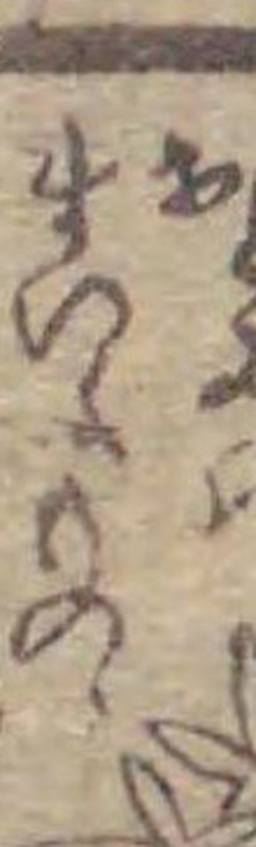まいよものゝ
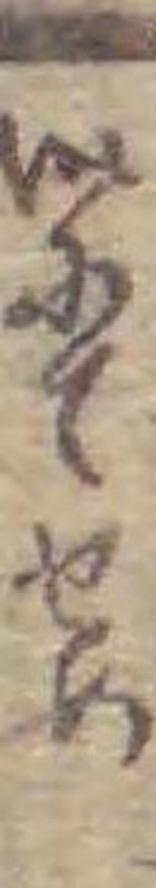けにてせめ
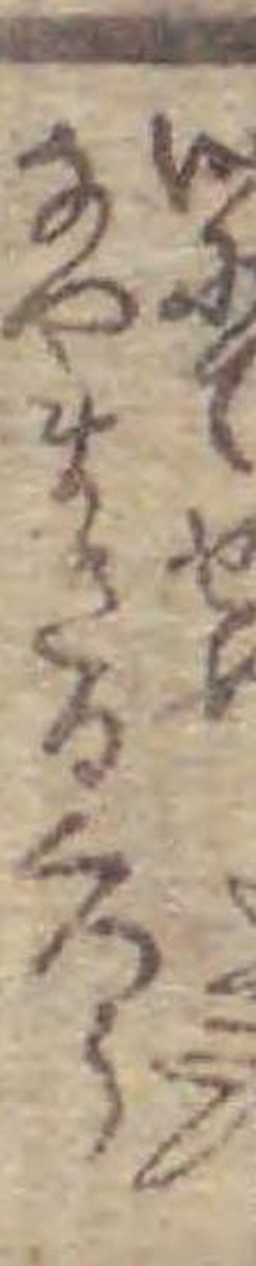なやまさるくつう
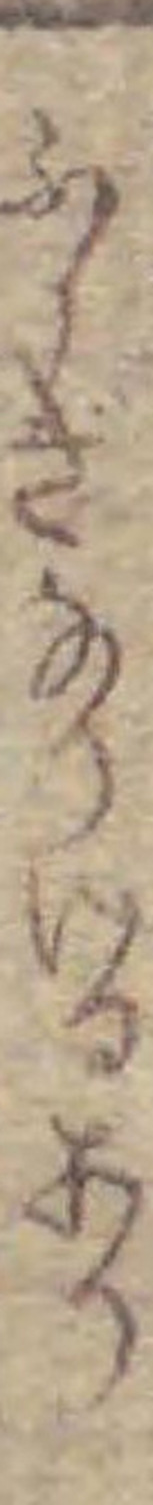ふしぎなりけるあり
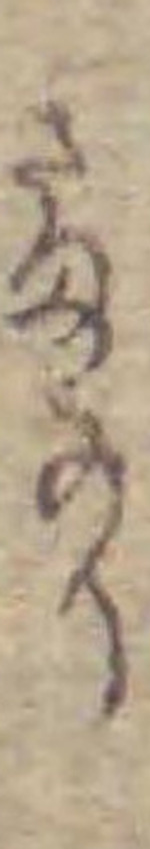さまなり

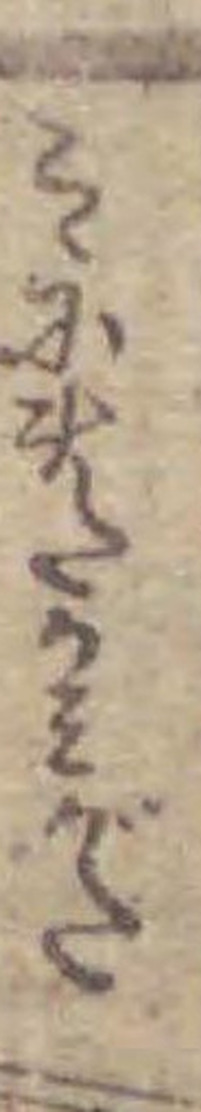こゝにまたかみがた
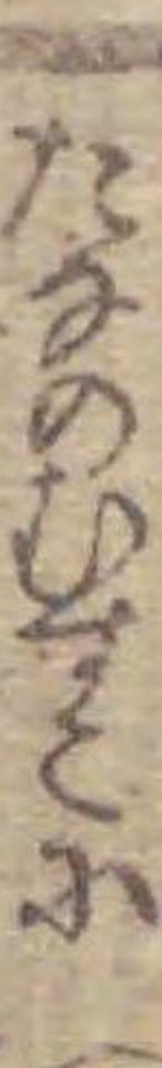たなのむすこに
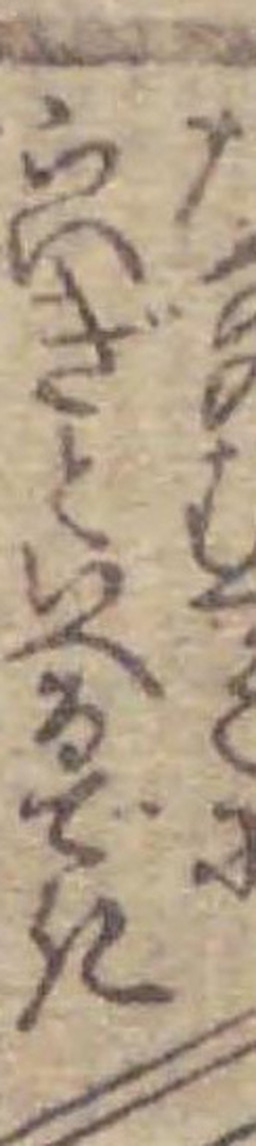らいぎといへるでき
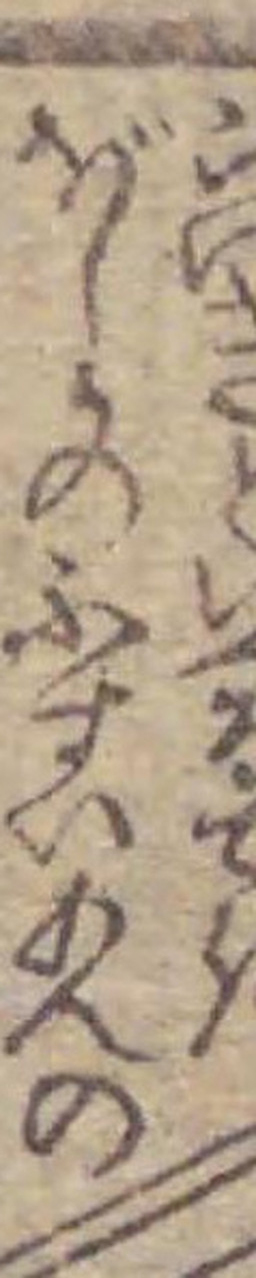ぼしかのふすいあんの
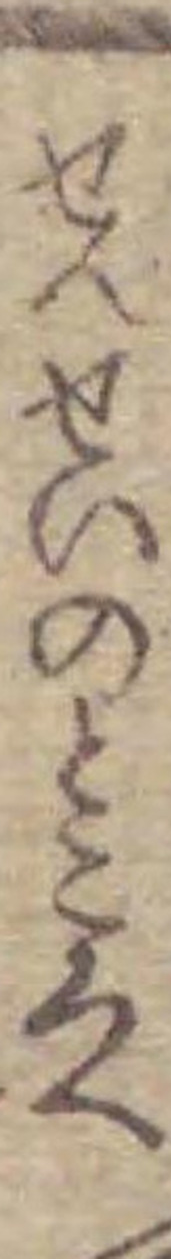せんせいのところへ
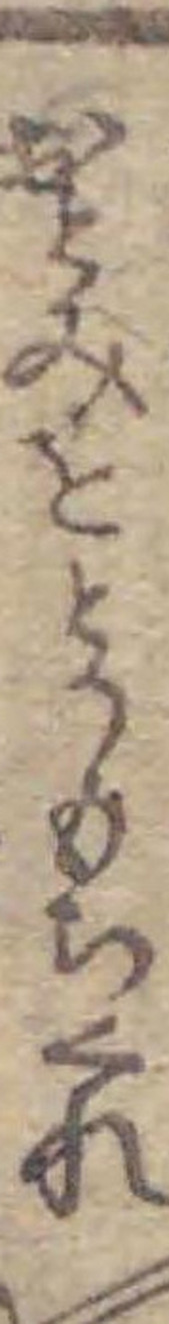おとみをとりもちくれ
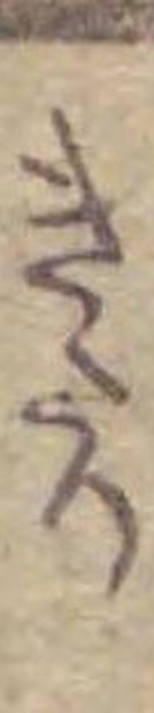きたり
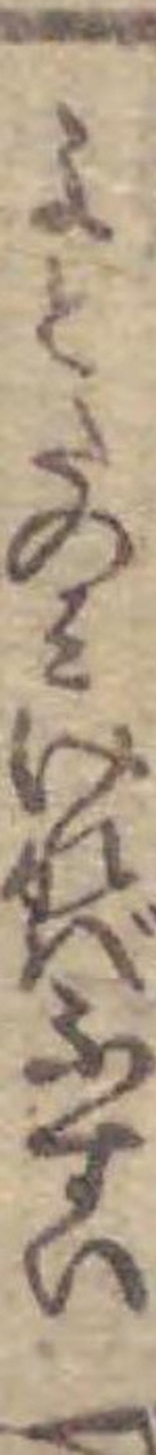よとたのみければふすい
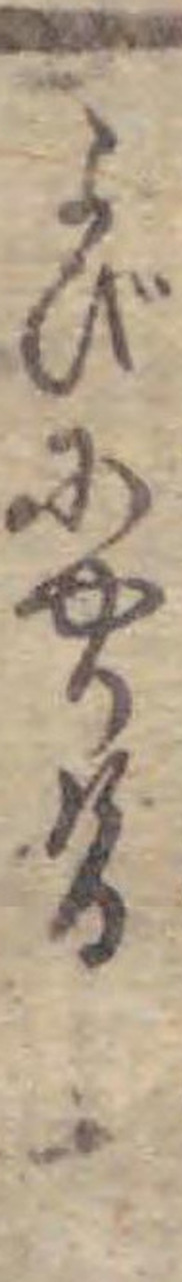よびにやりける
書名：芸者呼子鳥 : 2巻（松泉堂）
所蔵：国立国会図書館 National Diet Library, JAPAN
